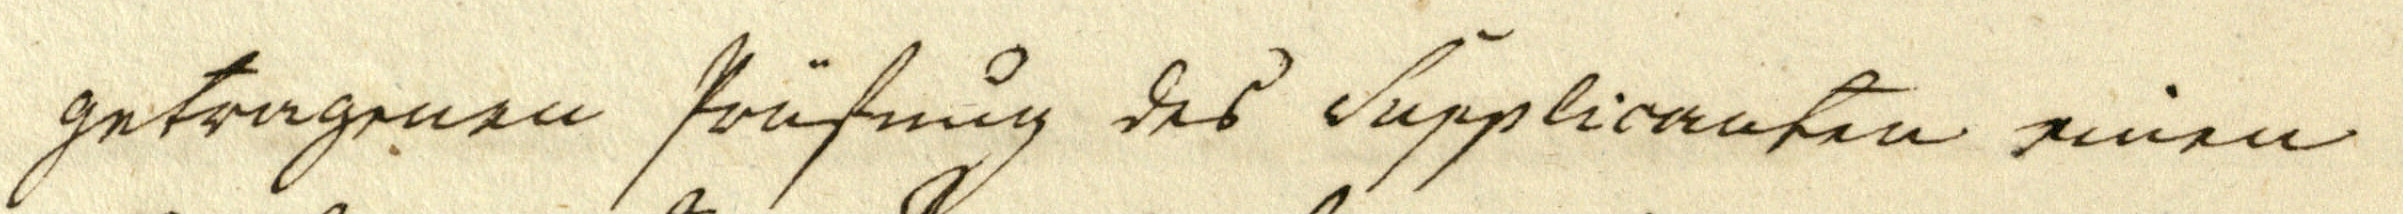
getragenen Prüfung des Supplicanten einen
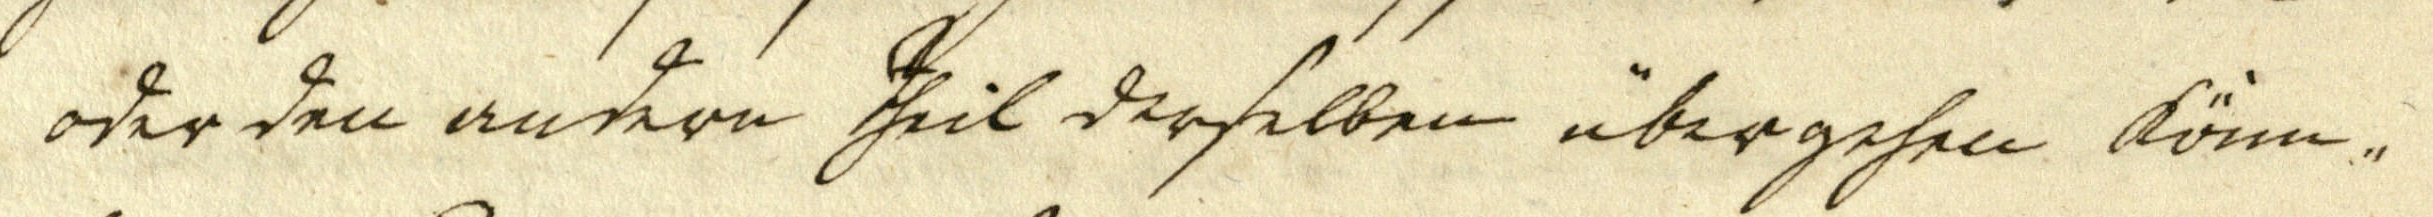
oder den andern Theil derselben übergehen könn¬
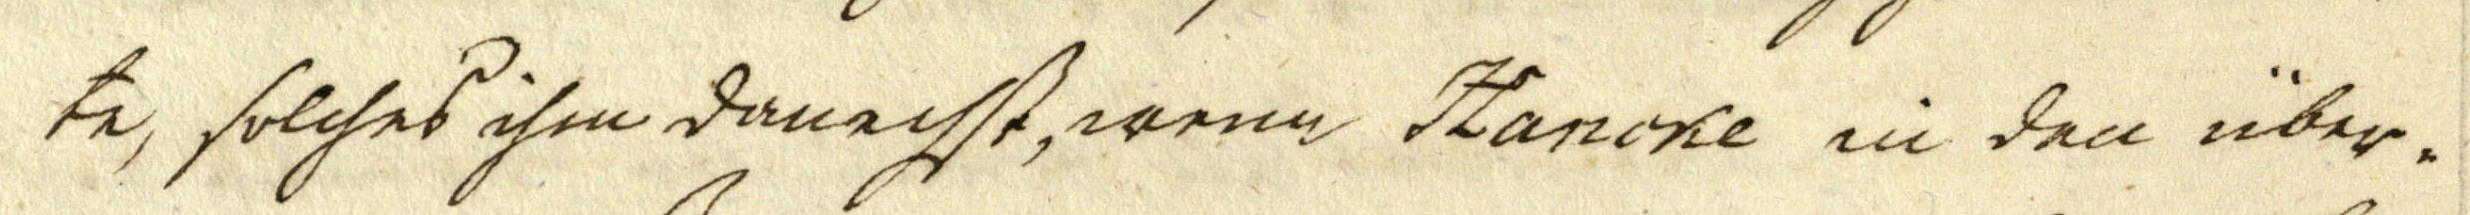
te, solches ihm danechst, wenn Hancke in den über¬
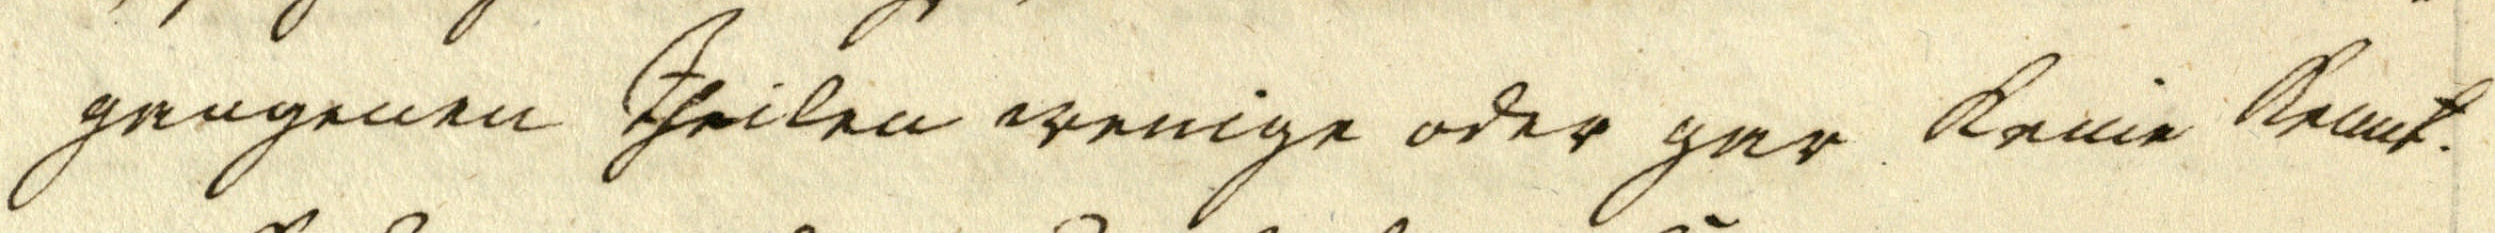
gangenen Theilen wenige oder gar keine Kennt¬
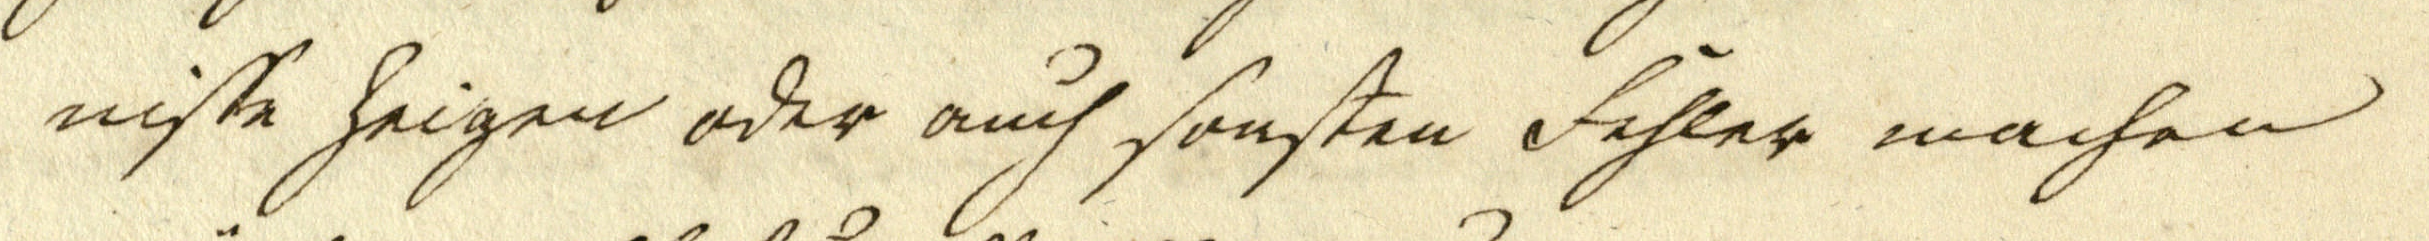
nisse zeigen oder auch sonsten Fehler machen
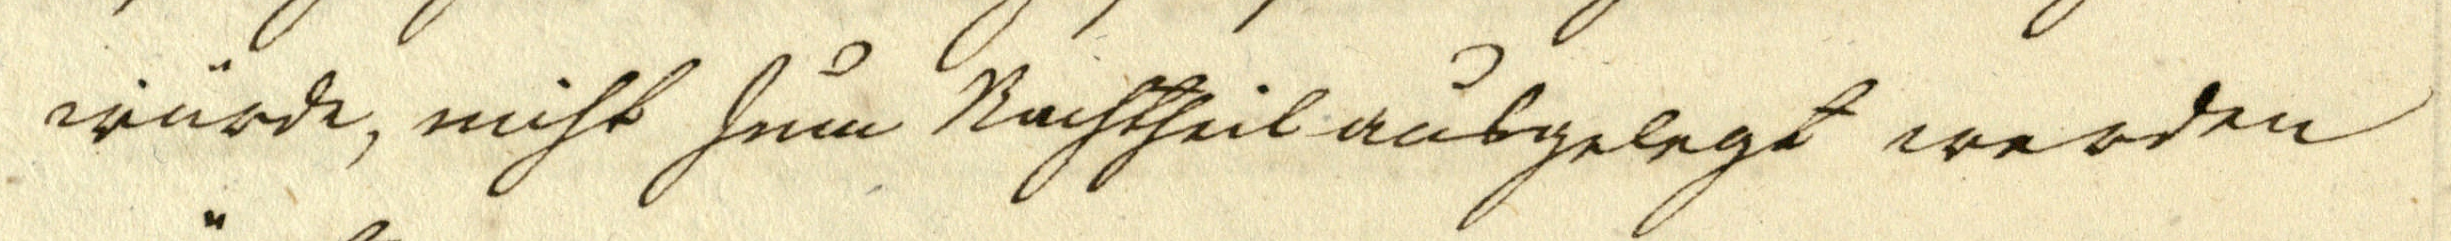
würde, nicht zum Nachtheil ausgelegt werden
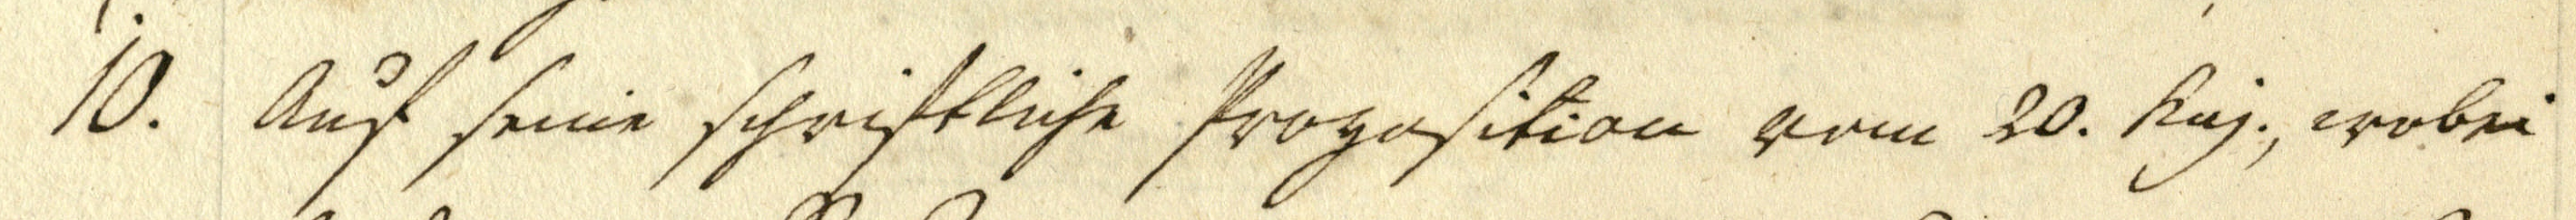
10. Auf seine schriftliche Proposition vom 20. huj., wobei
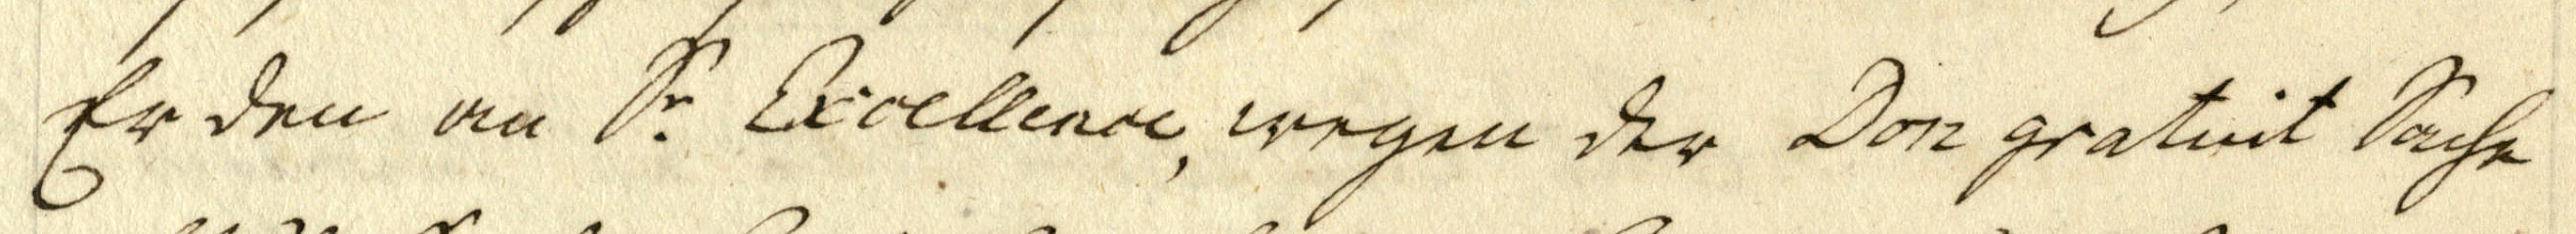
Er den an Sr. Excellence, wegen der Don gratuit Sache
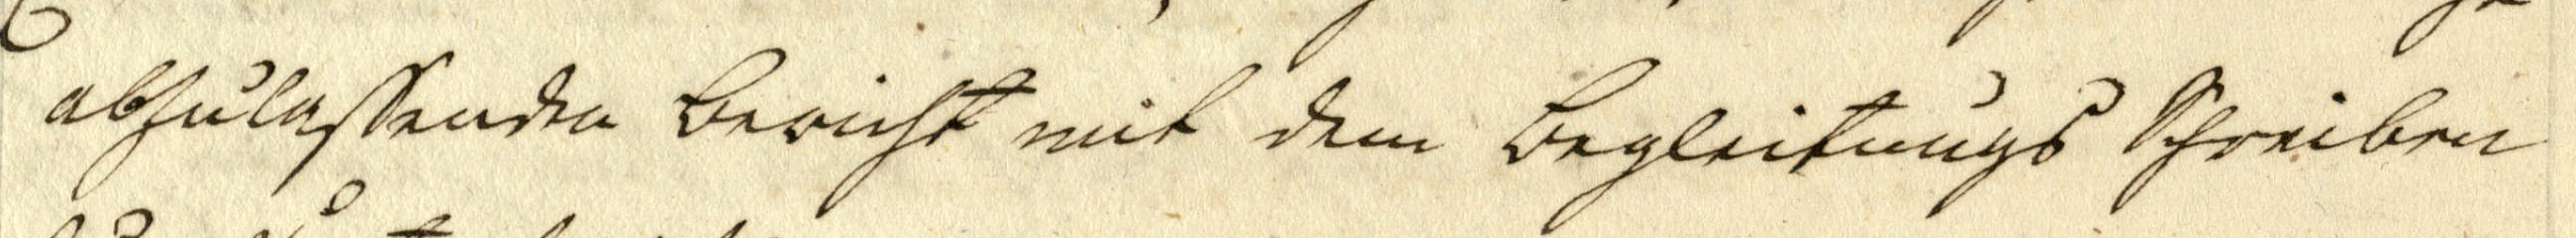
abzulassenden Bericht mit dem Begleitungs Schreiben
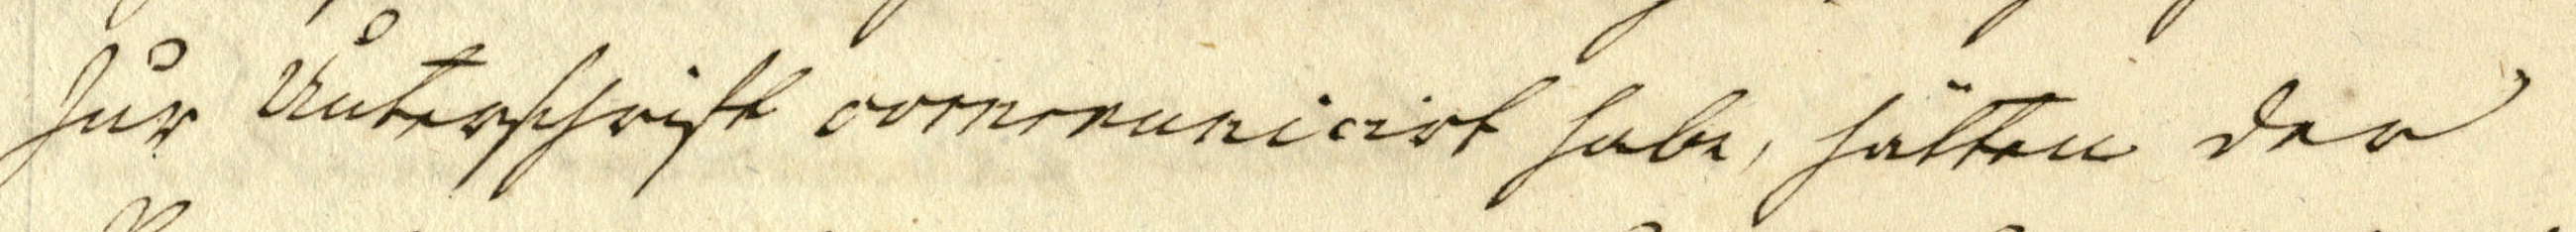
zur Unterschrift communicirt habe, hätten der
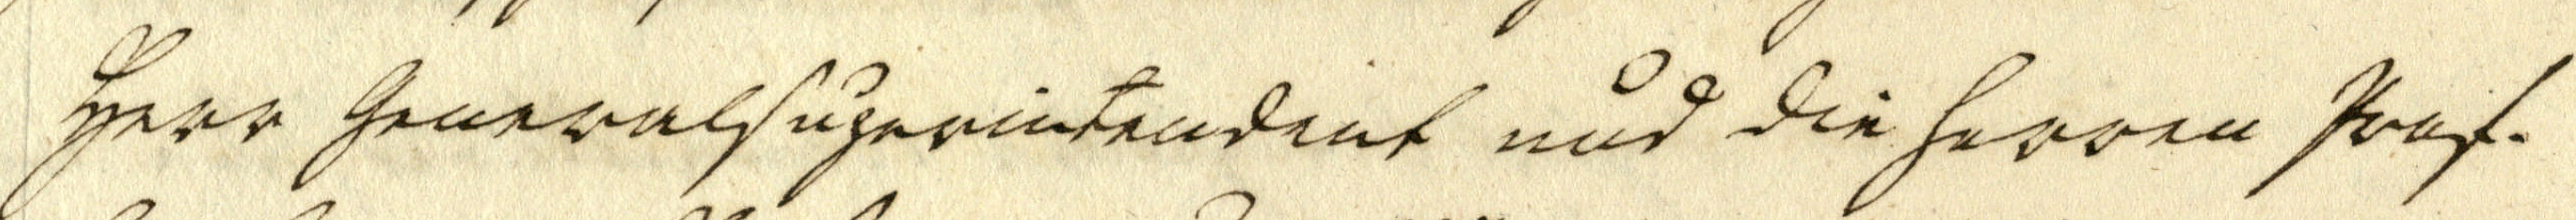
Herr Generalsuperintendent und die herren Prof.
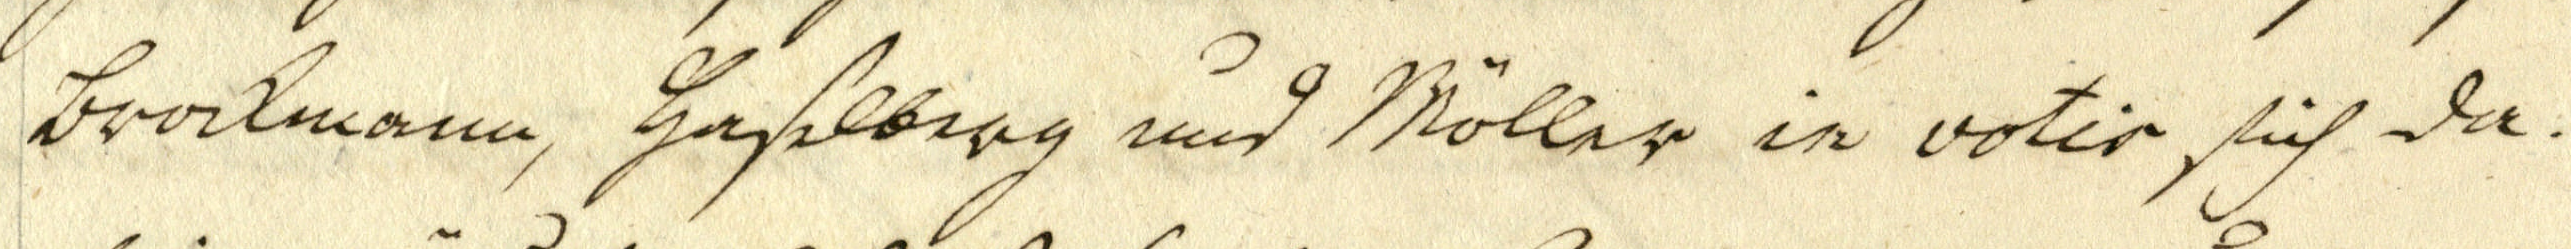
Brockmann, Haselberg und Möller in votis, sich da¬
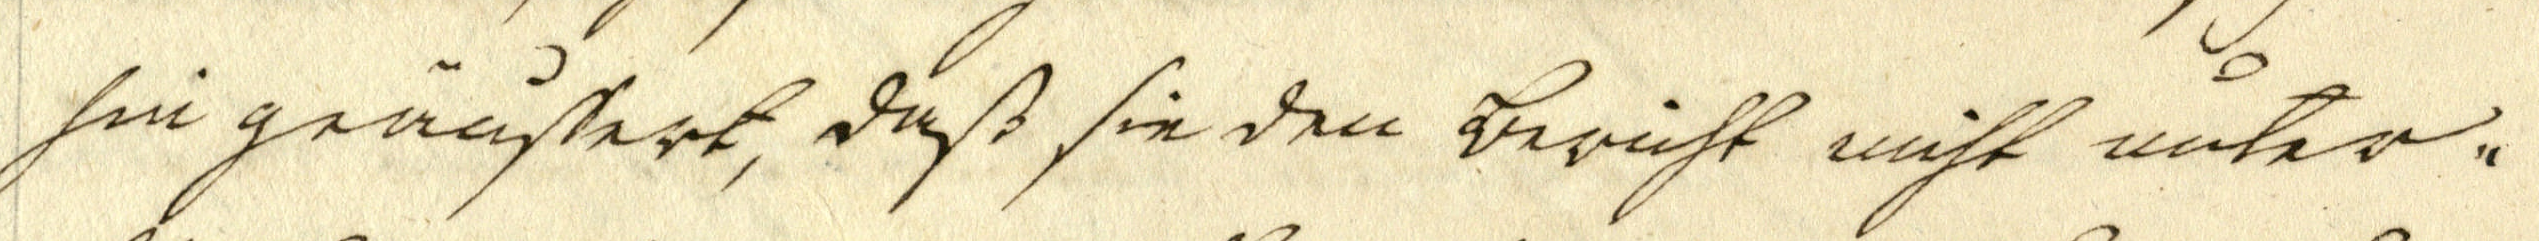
hin geäussert, daß sie den Bericht nicht unter¬
